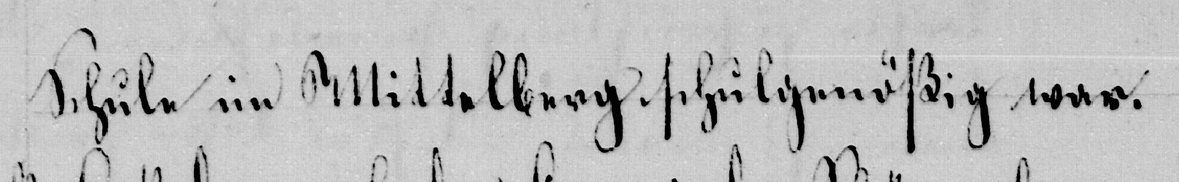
Schule im Mittelberg schulgenößig war.
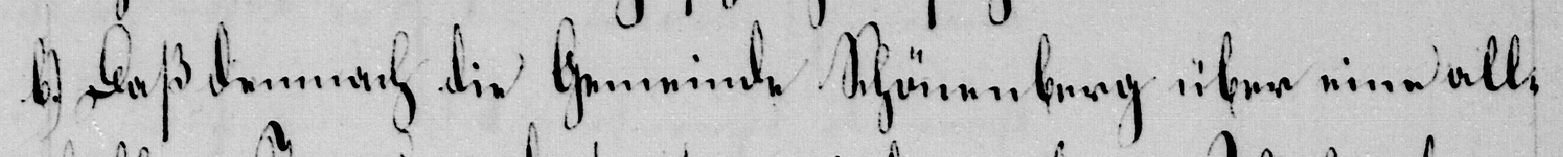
b.) Daß demnach die Gemeinde Schönenberg über eine all¬
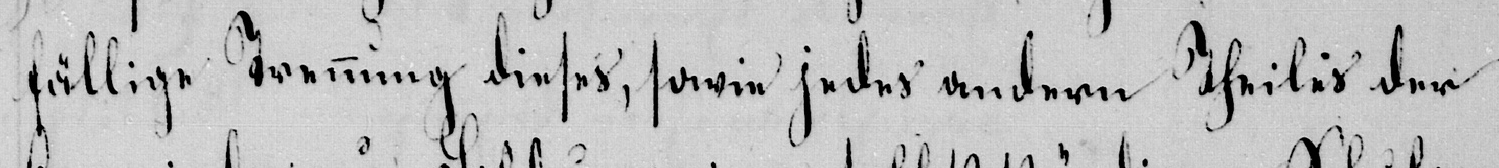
fällige Trennung dieses, sowie jedes andern Theiles der
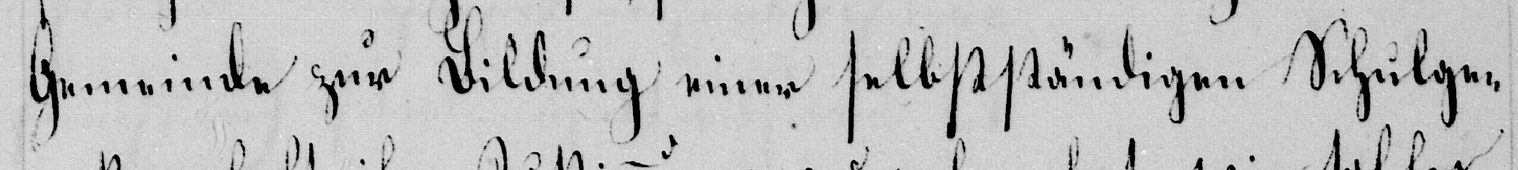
Gemeinde zur Bildung einer selbstständigen Schulge¬
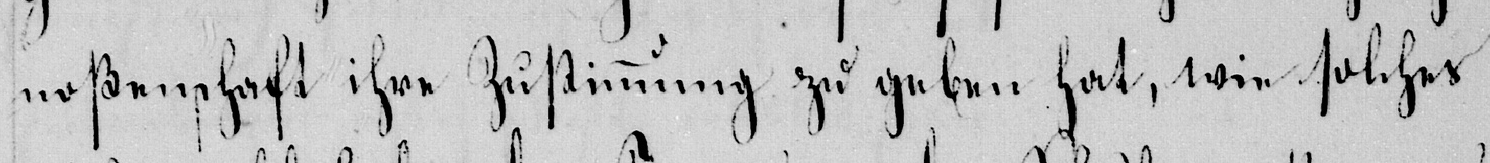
noßenschaft ihre Zustimmung zu geben hat, wie solches
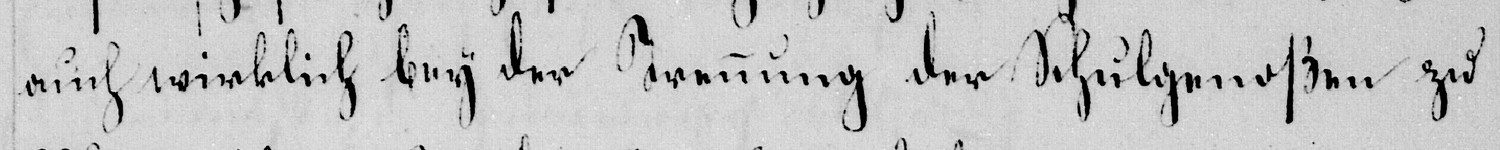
auch wirklich bey der Trennung der Schulgenoßen zu
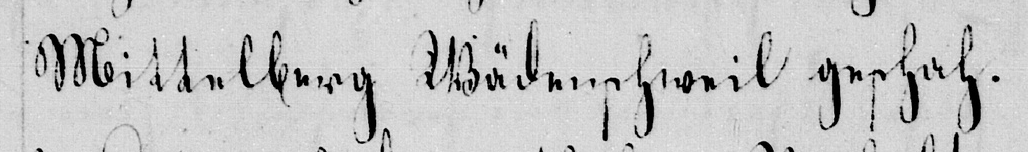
Mittelberg Wädenschweil geschah.
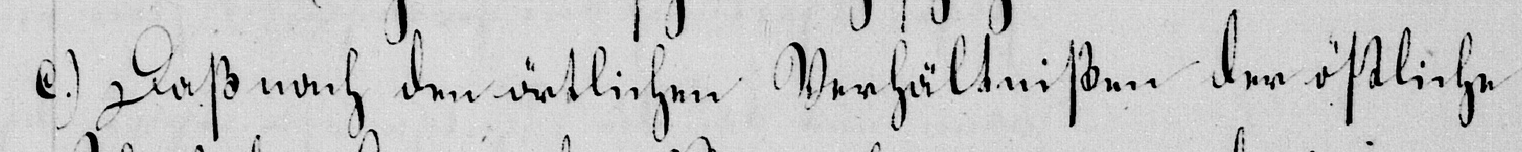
c.) Daß nach den örtlichen Verhältnißen der östliche
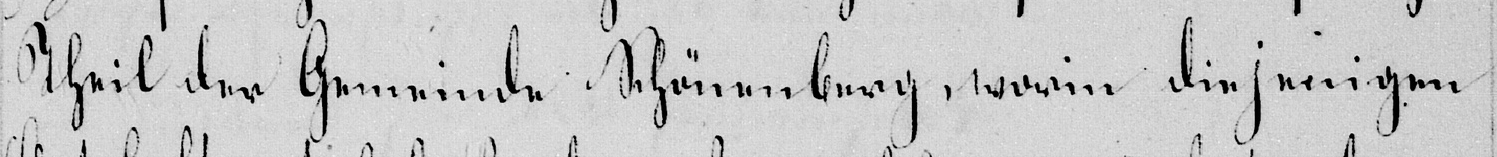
Theil der Gemeinde Schönenberg, worin diejenigen
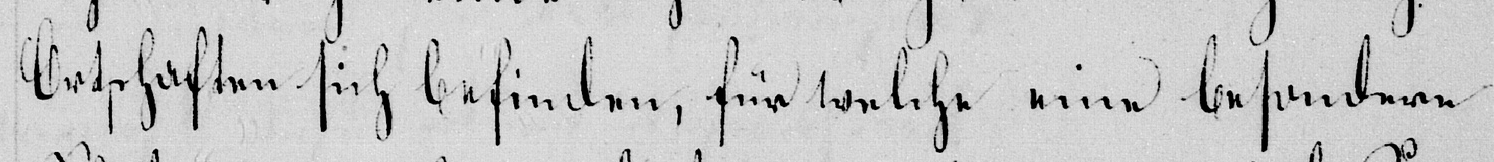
Ortschaften sich befinden, für welche eine besondere
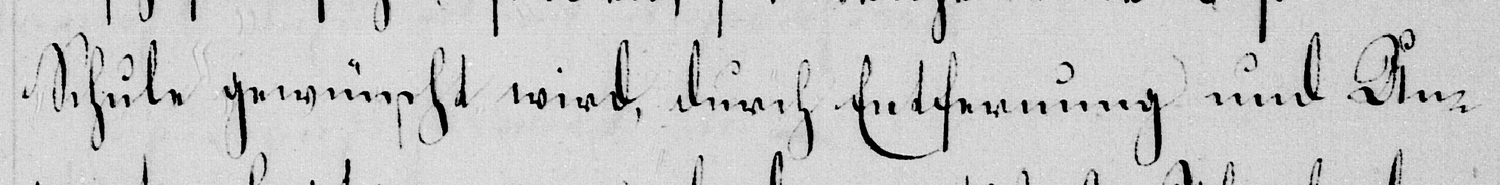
Schule gewünscht wird, durch Entfernung und Un¬
